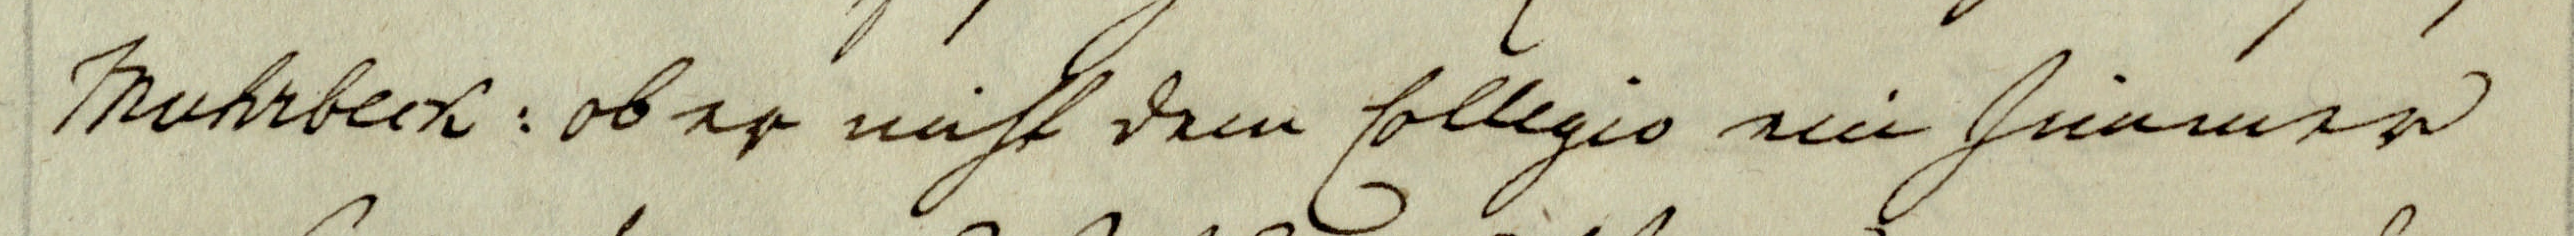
Muhrbeck: ob er nicht dem Collegio ein Zimmer
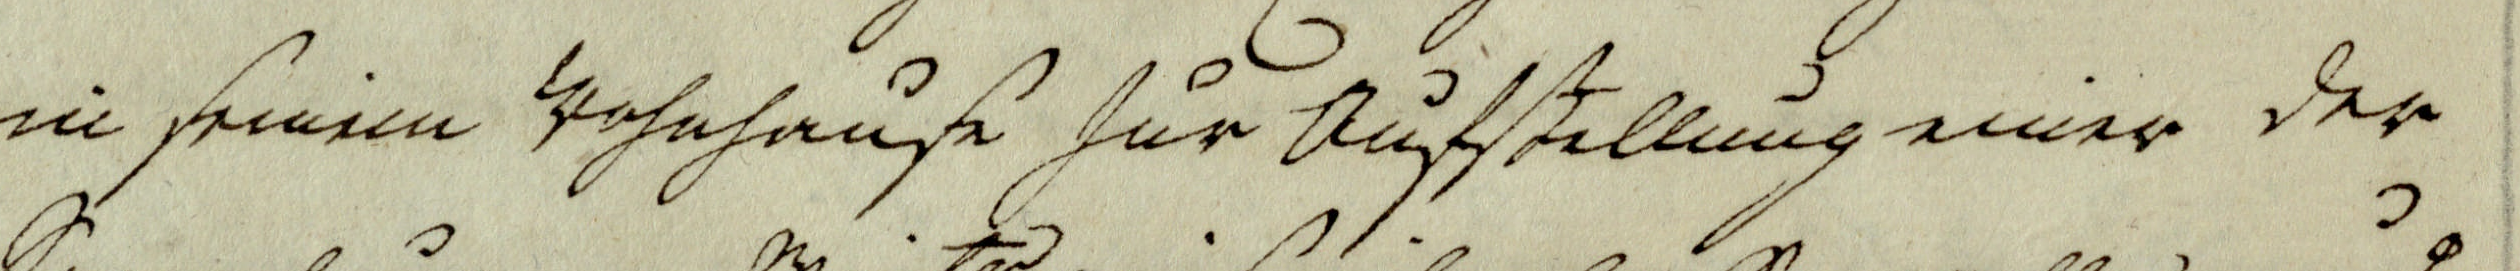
in seinem Wohnhause zur Aufstellung einer der
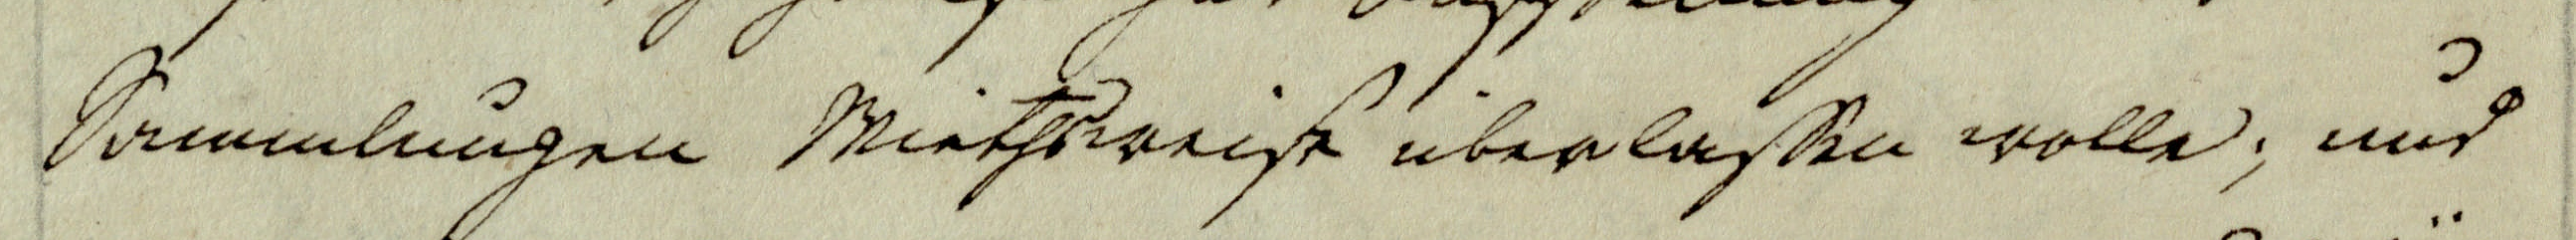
Sammlungen Miethsweise überlassen wolle; und
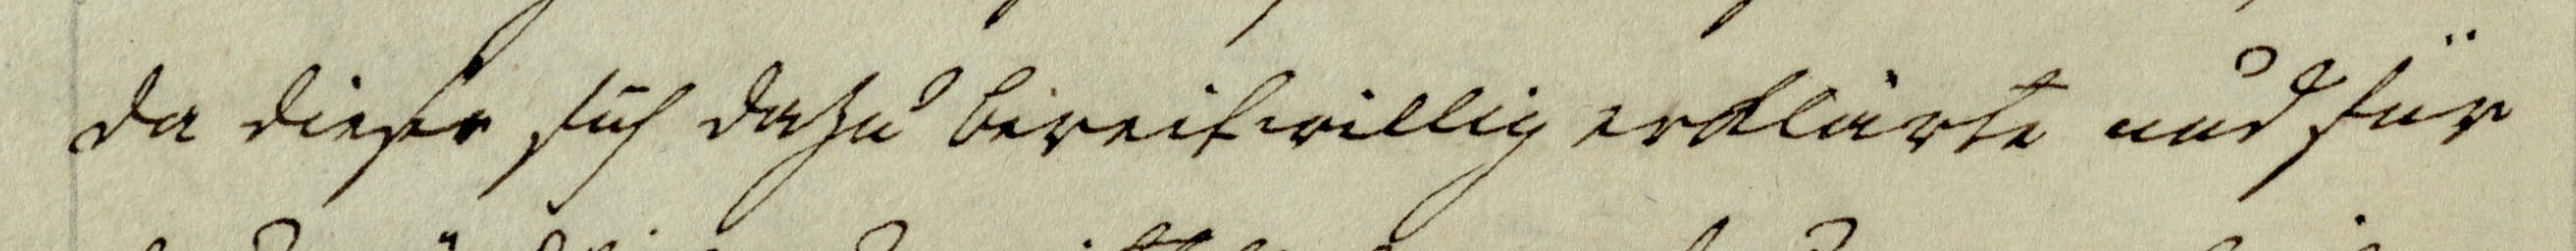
da dieser sich dazu bereitwillig erklärte und für
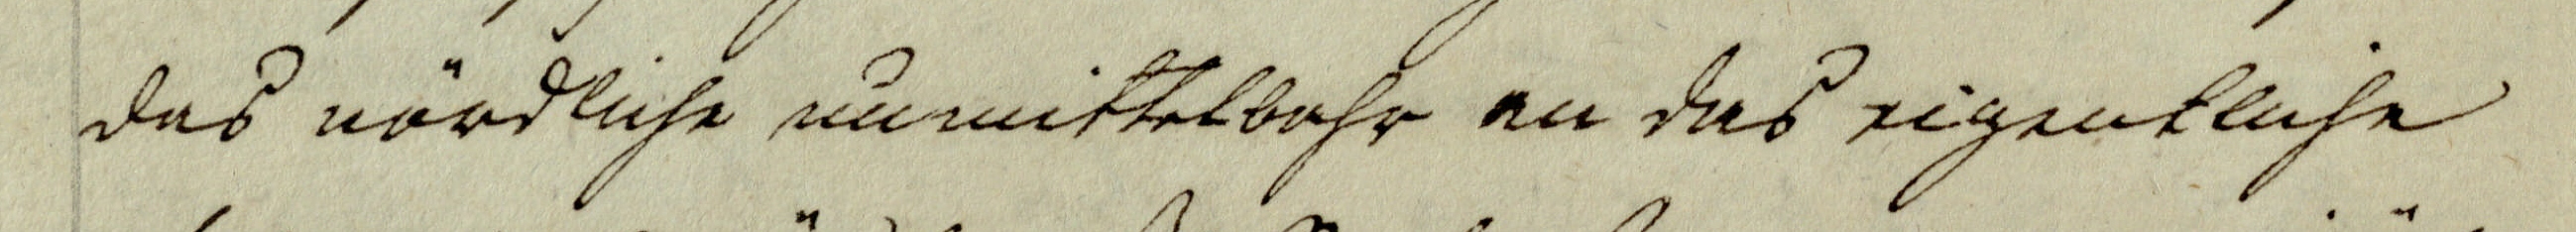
das nördliche unmittelbahr an das eigentliche
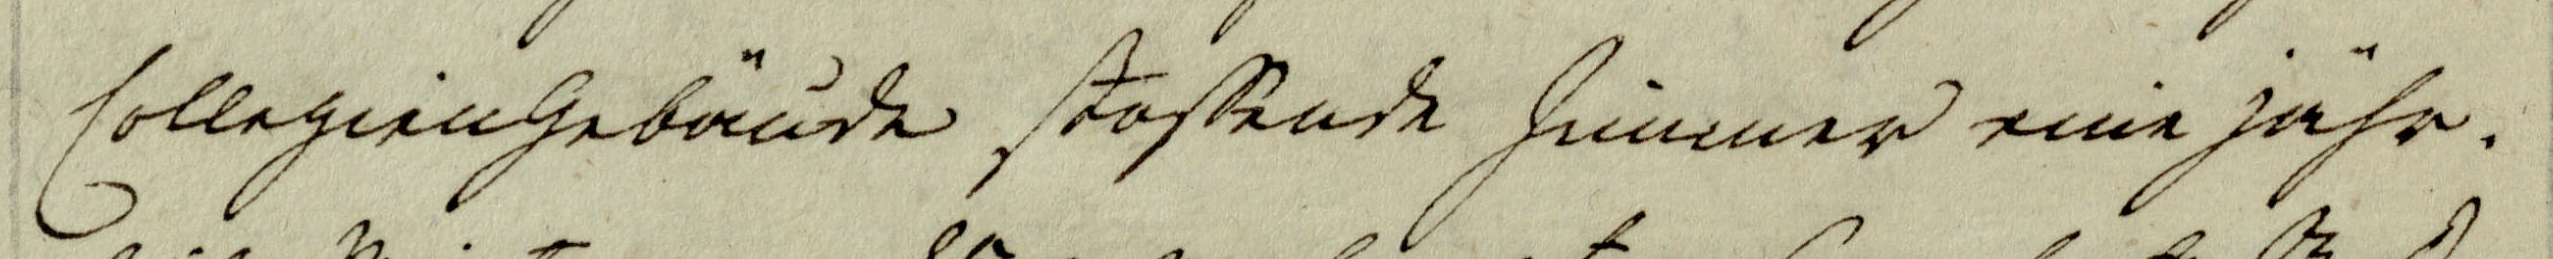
Collegiengebäude stossende Zimmer eine jähr¬
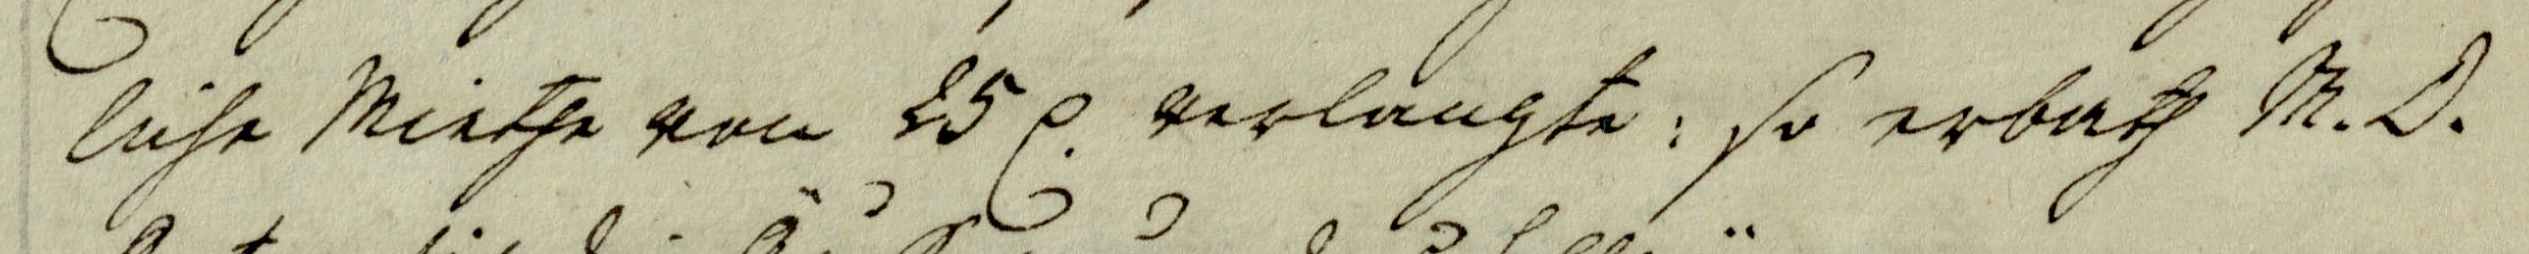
liche Miethe von 25 l. verlangte: so erbath M. D.
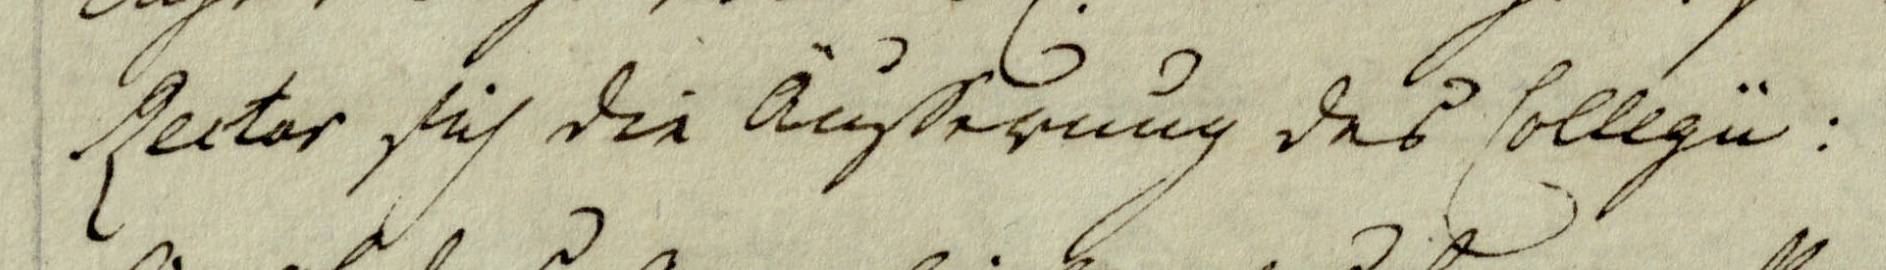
Rector sich die Äusserung des Collegii:
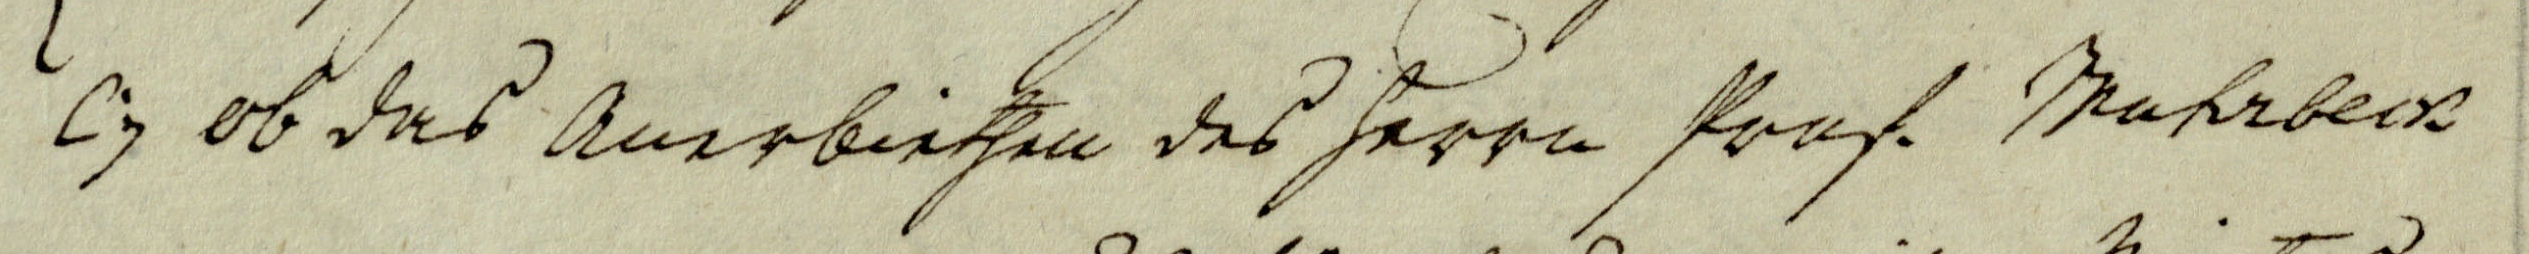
c., ob das Anerbiethen des Herrn Prof. Muhrbeck
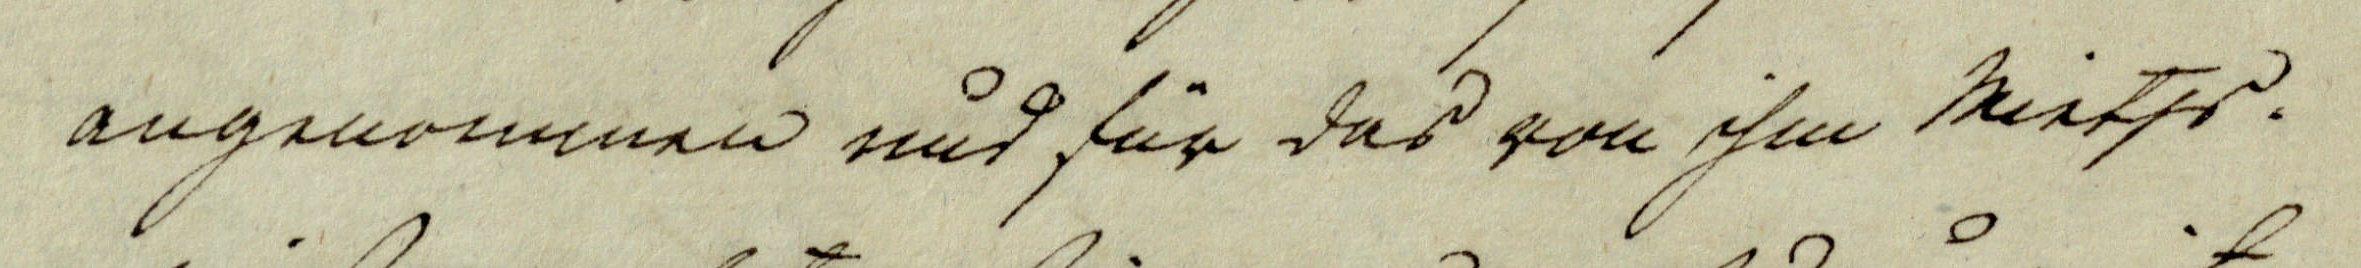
angenommen und für das von ihm Mieths¬
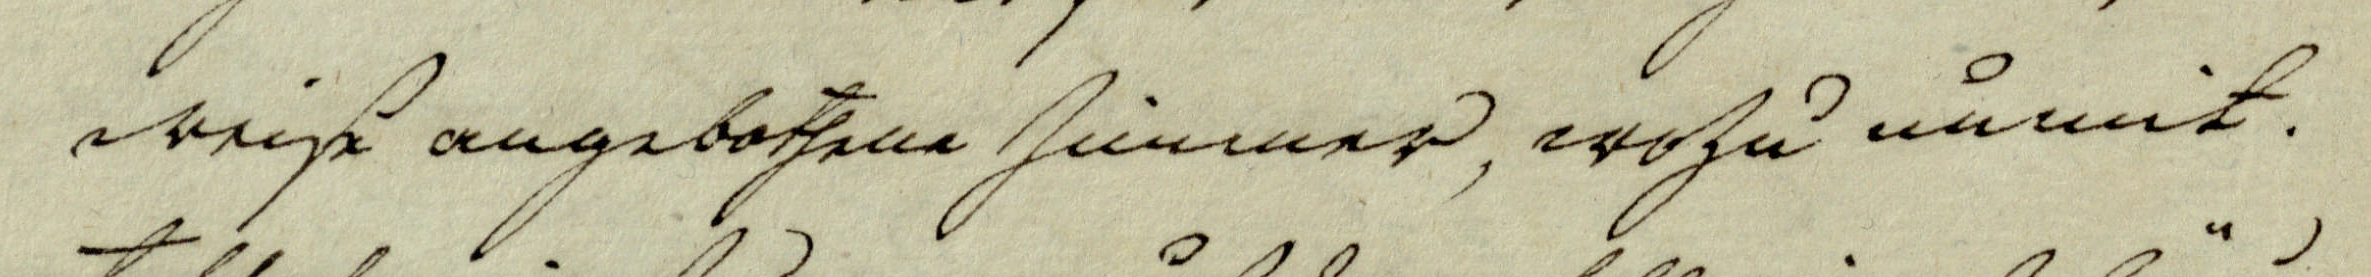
weise angebothene Zimmer, wozu mit¬
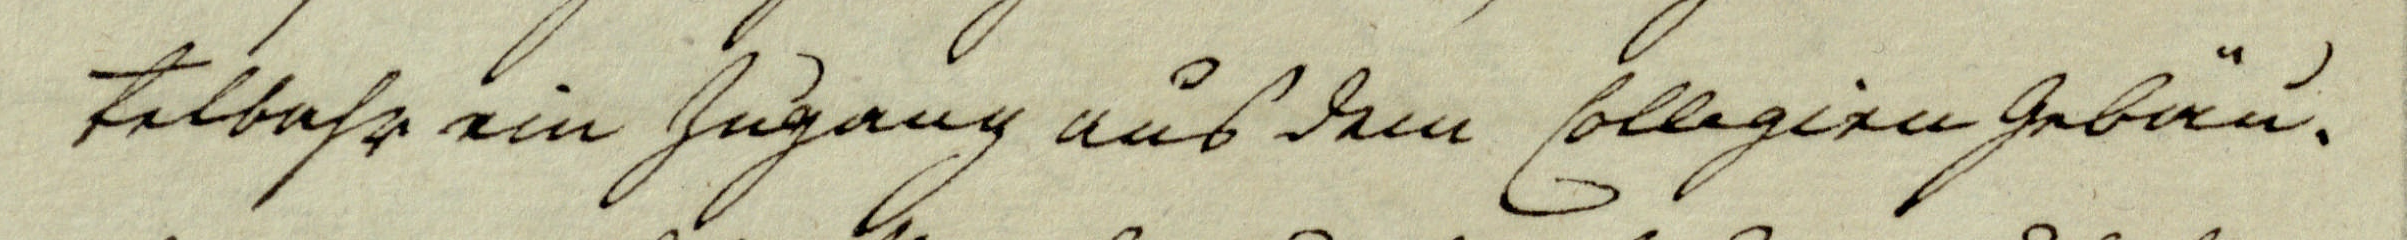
telbahr ein Zugang aus dem Collegien Gebäu¬
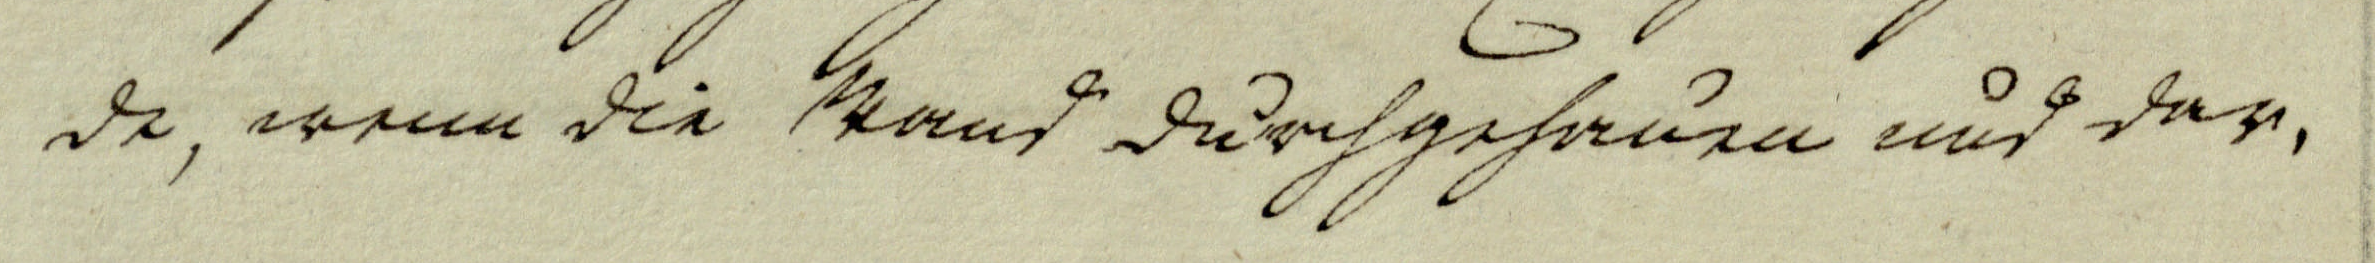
de, wenn die Wand durchgehauen und dar¬
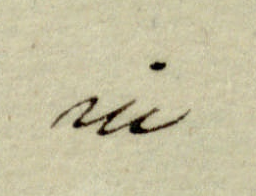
in
